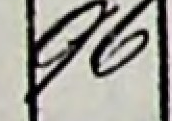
96
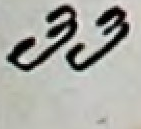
33
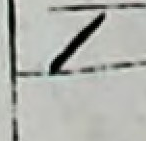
I
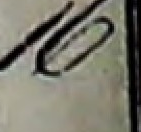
16
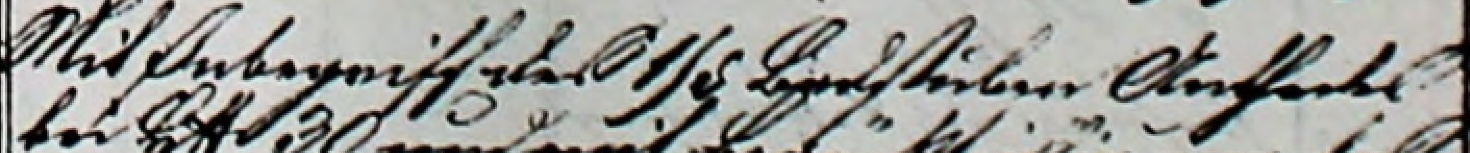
Mit Inbegriff des 95 Badstuben Antheiles
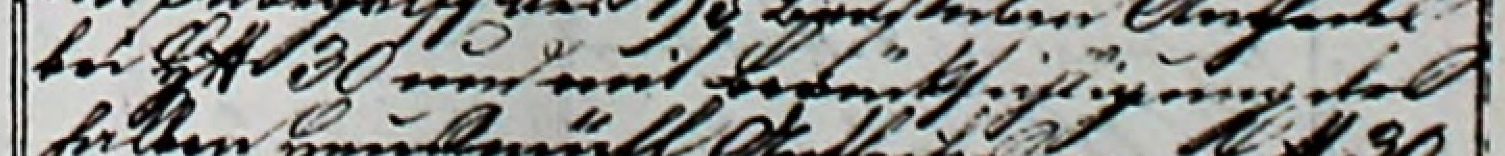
bei H? 30 und mit Berücksichtigung des
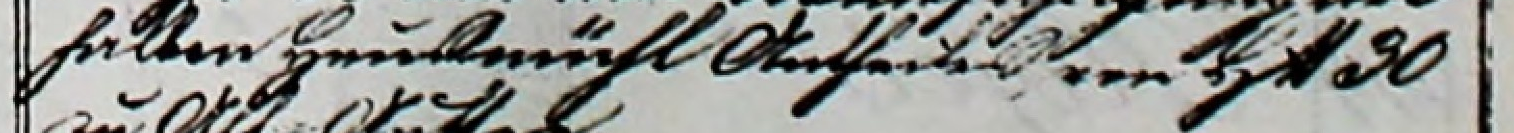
halben Hausmühl Antheiles von H? 30
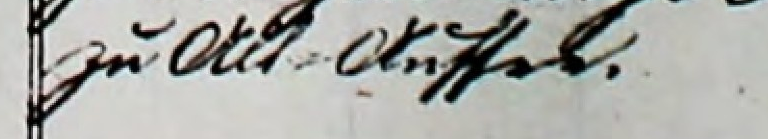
zu Alt-Aussee.
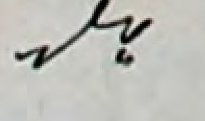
do
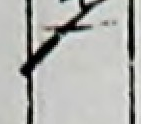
7
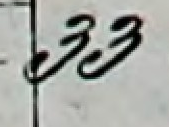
33
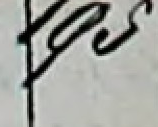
195
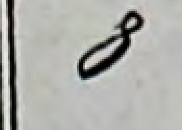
8
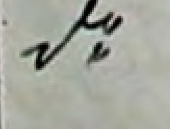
do
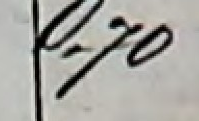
0,70
